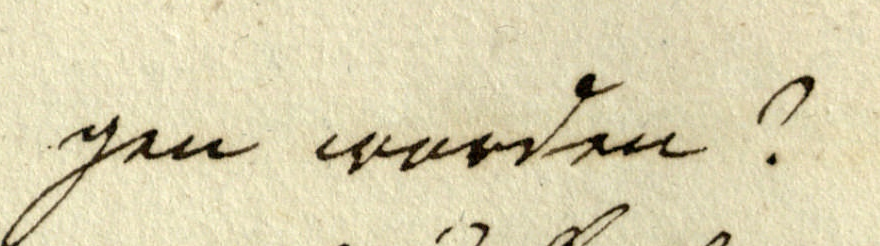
gen worden ?
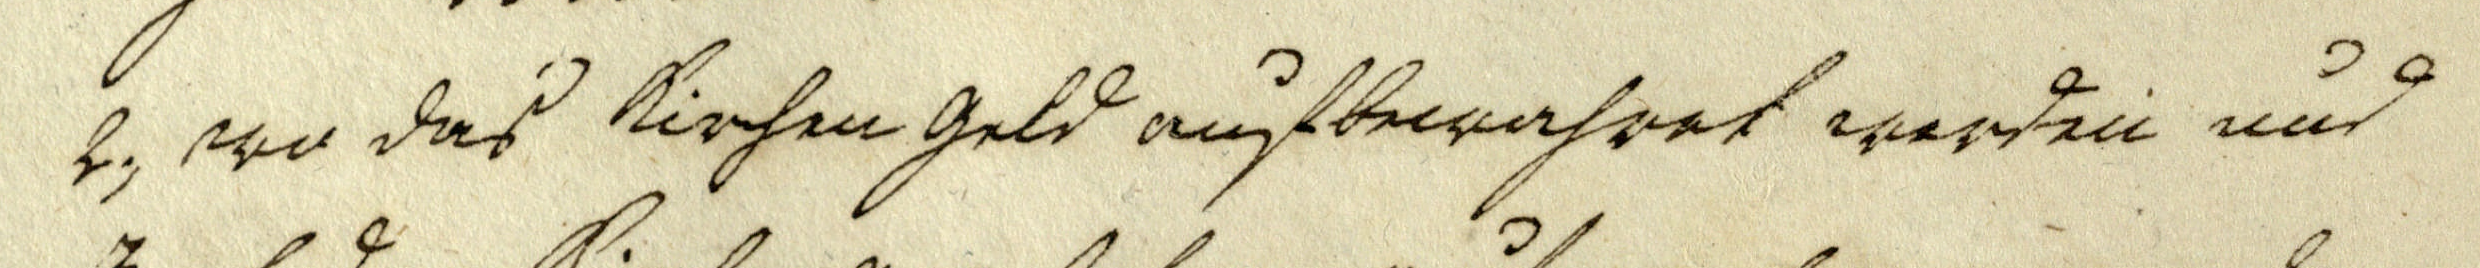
2., wo das Kirchen Geld aufbewahret werden und
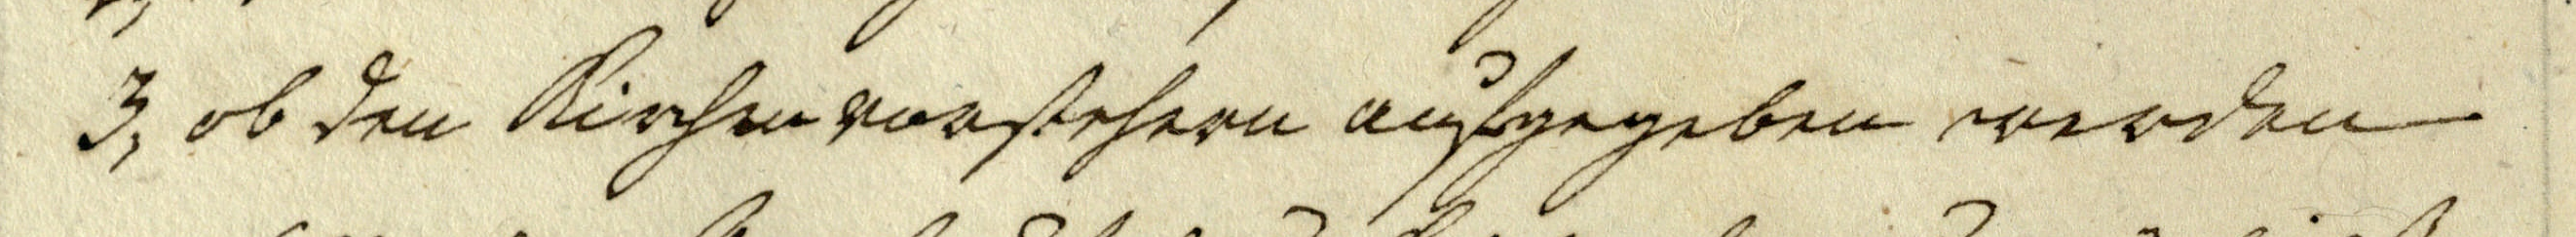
3., ob den Kirchenvorstehern aufgegeben werden
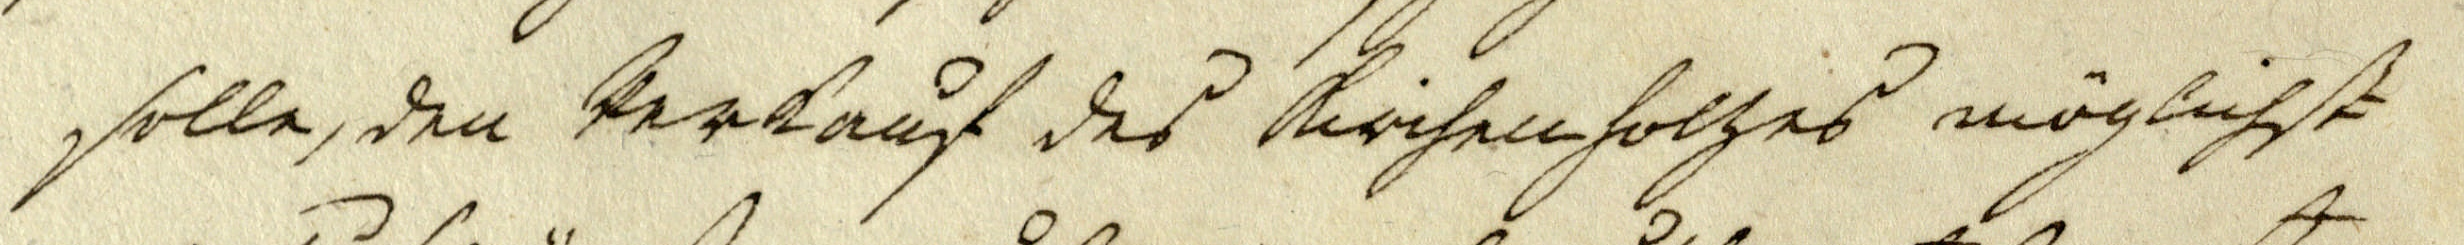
solle, den Verkauf des Kirchenholzes möglichst
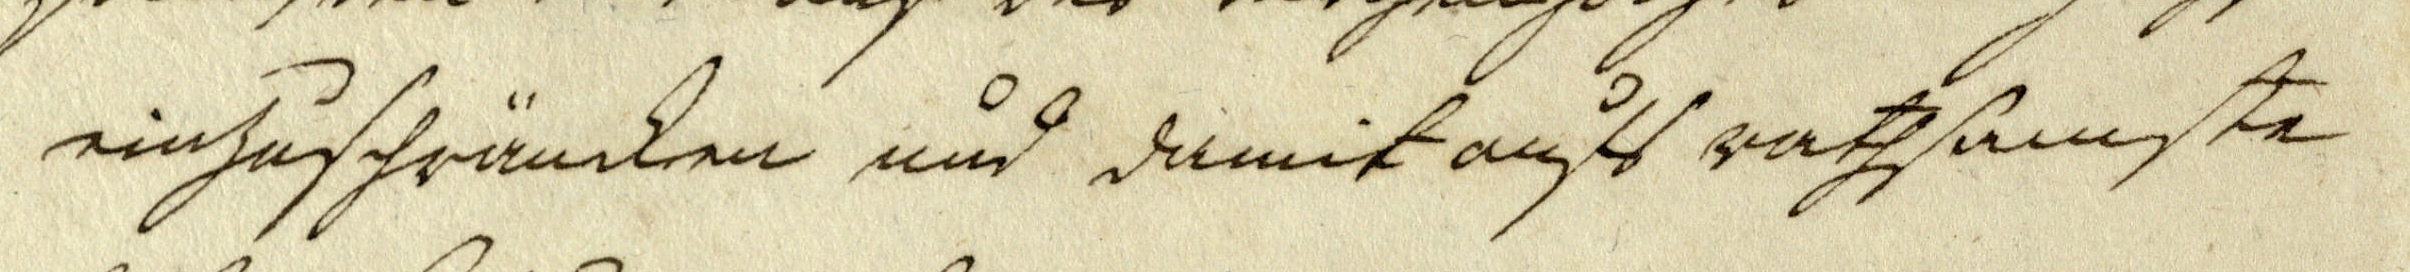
einzuschräncken und damit aufs rathsamste
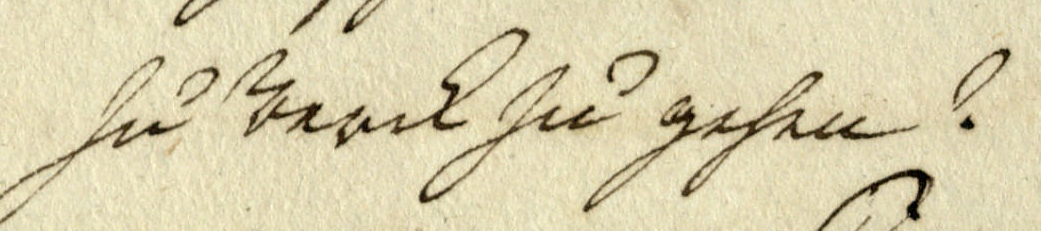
zu Werck zu gehen?
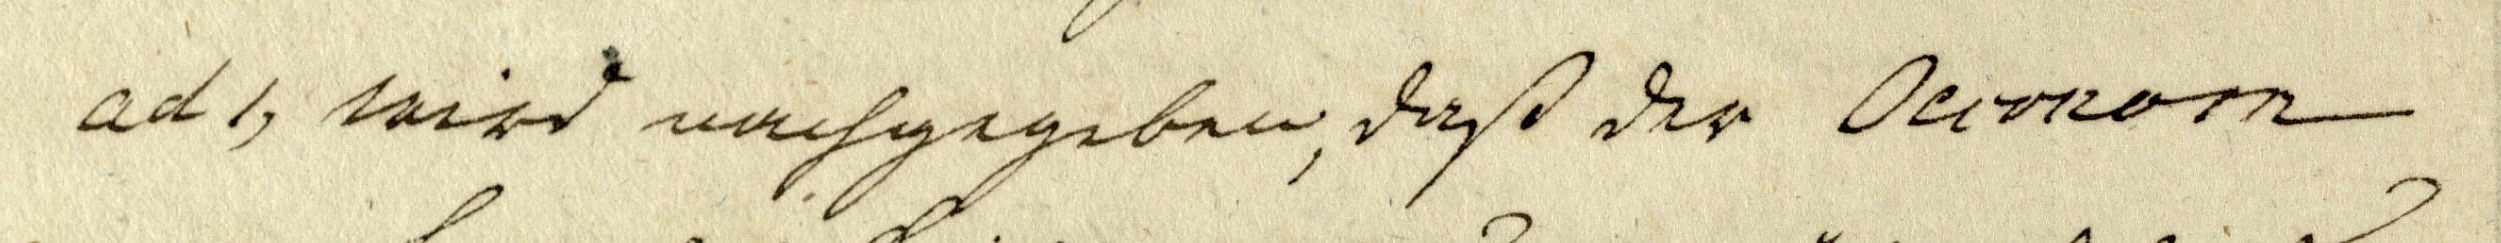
ad 1., wird nachgegeben, daß der Oeconom
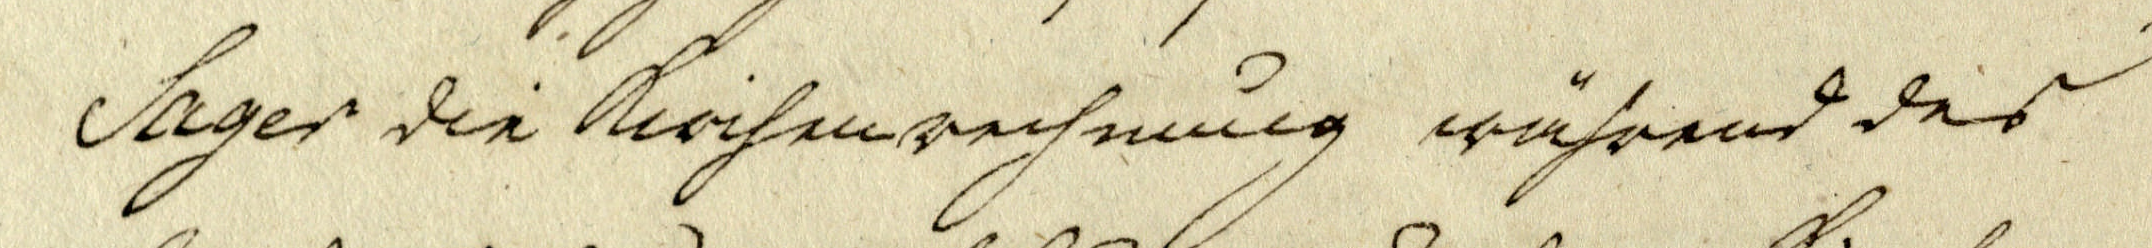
Sager die Kirchenrechnug während des
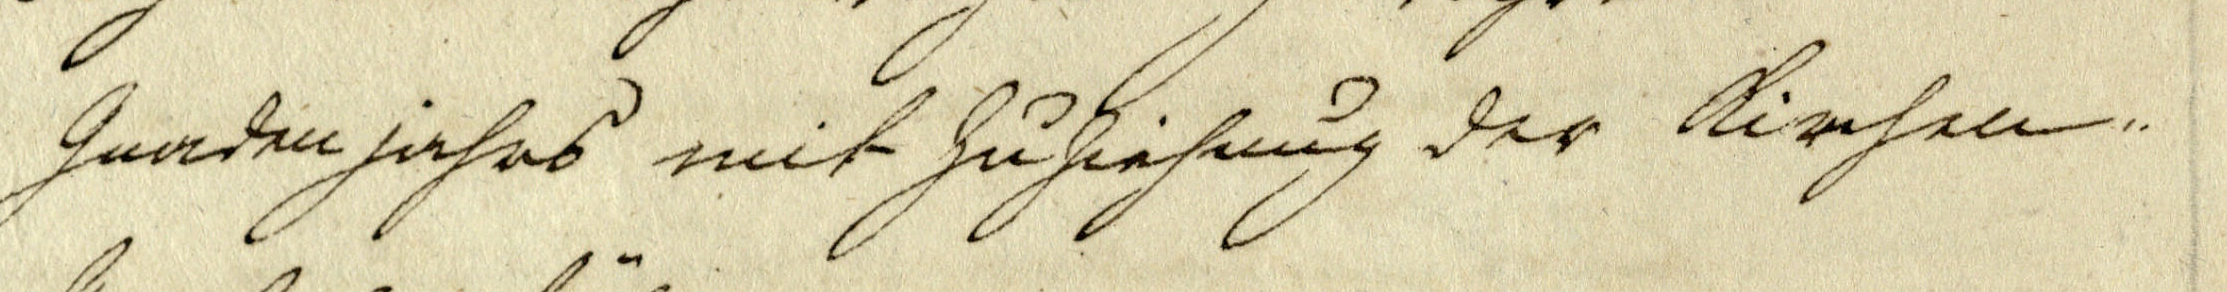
Gnadenjahrs mit Zuziehnung der Kirchen¬
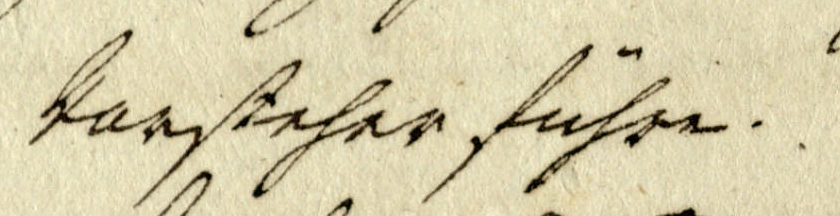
Vorsteher führe.
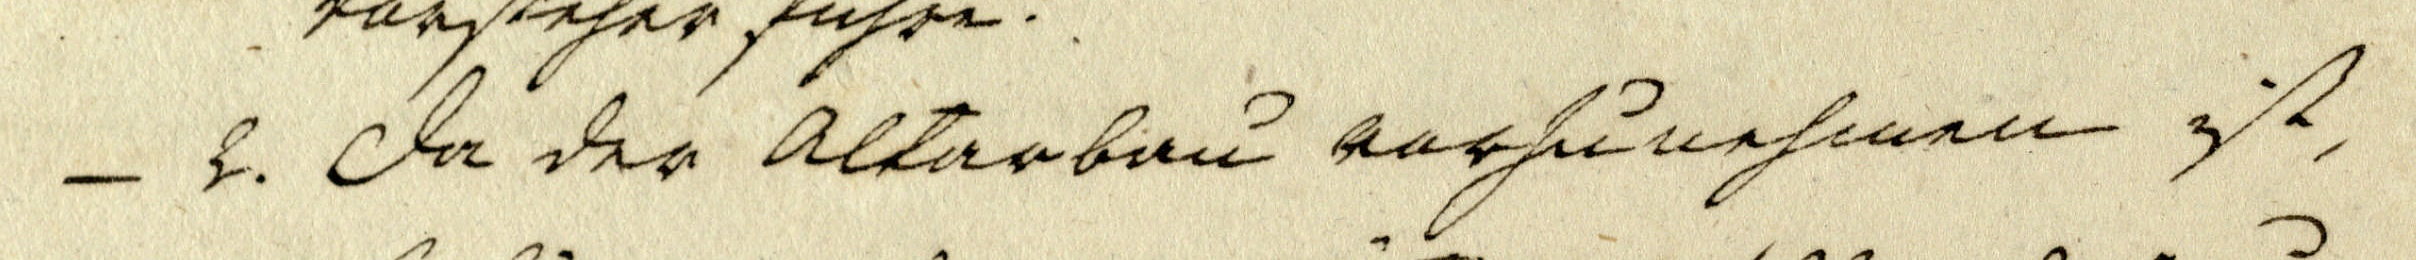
2. Da der Altarbau vorzunehmen ist,
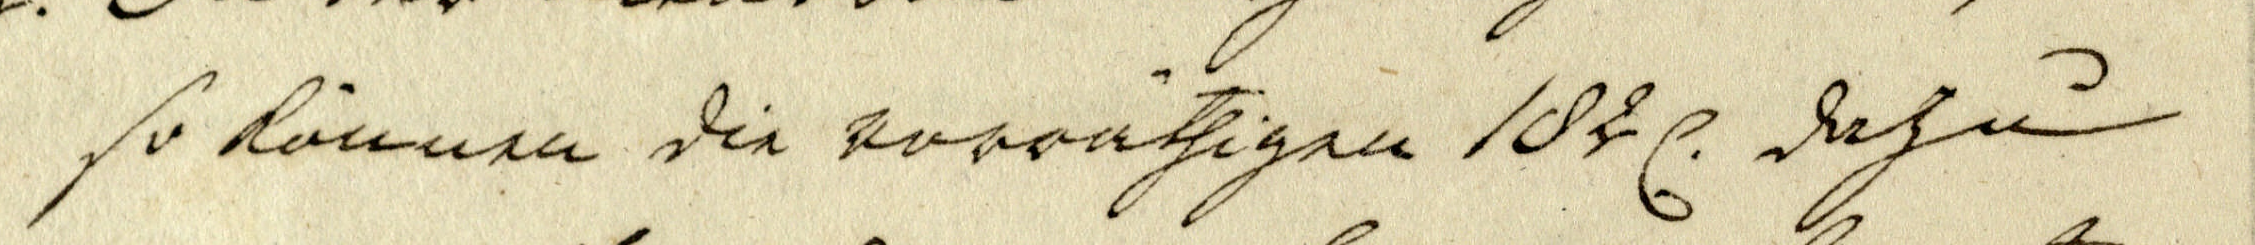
so können die vorräthigen 182 l. dazu
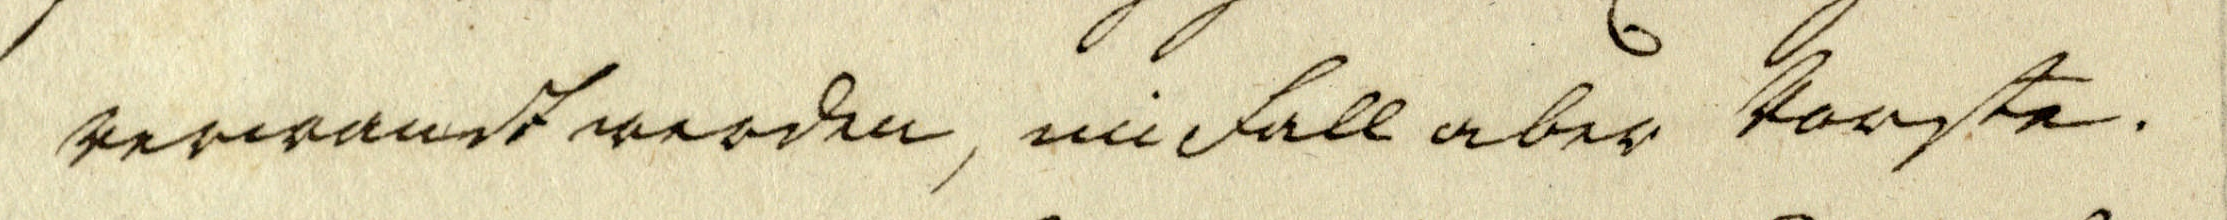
verwandt werden, im Fall aber Vorste¬
